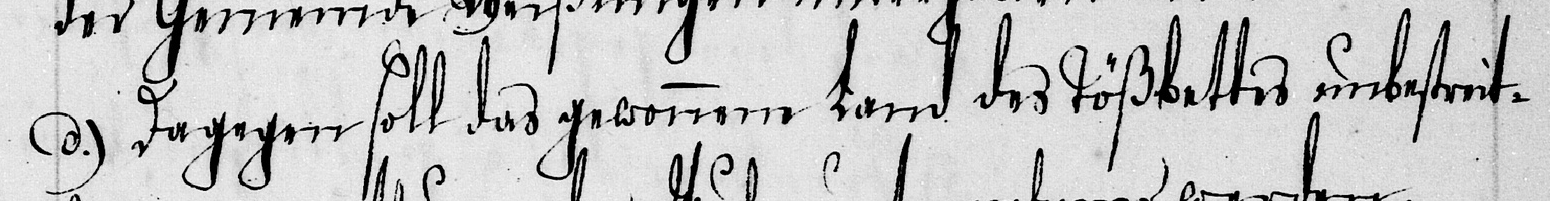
d.) Dagegen soll das gewonnene Land des Tößbettes unbestrei¬
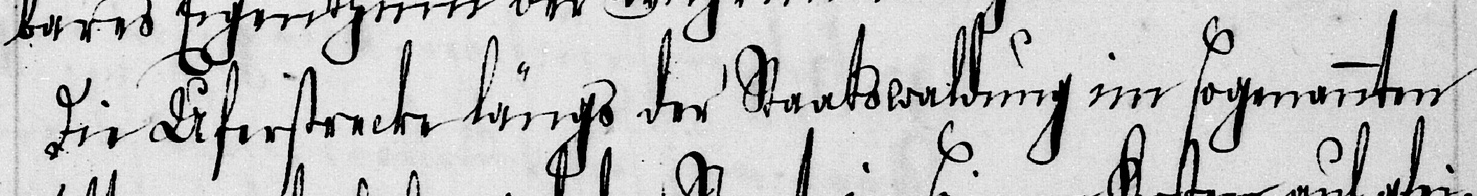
Die Uferstrecke längs der Staatswaldung im sogenannten
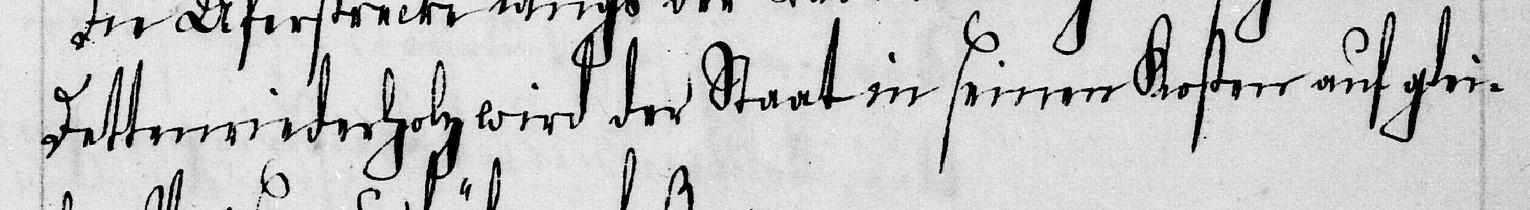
Dettenriederholz wird der Staat in seinen Kosten auf glei¬
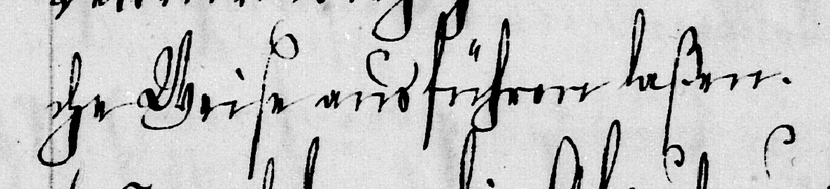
che Weise ausführen laßen.
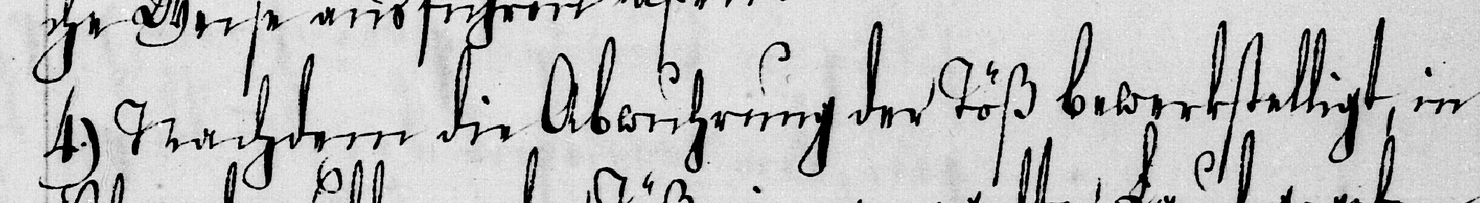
4.) Nachdem die Abwuhrung der Töß bewerkstelligt,
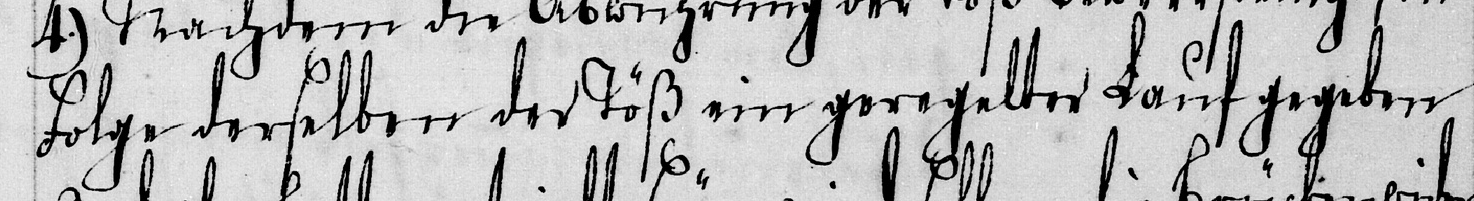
Folge derselben der Töß ein geregelter Lauf gegeben
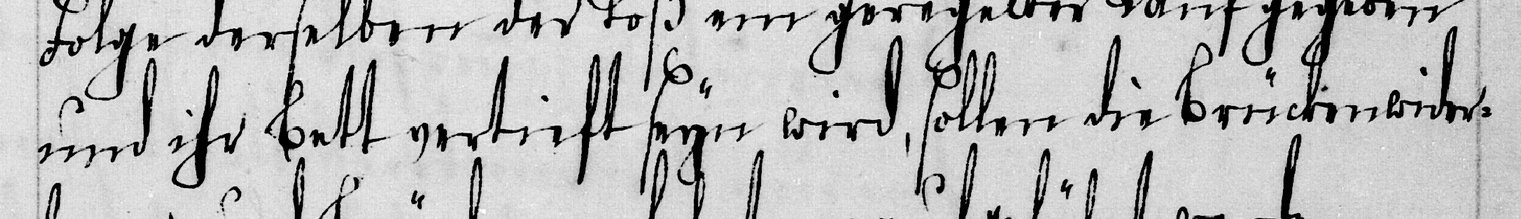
und ihr Bett vertieft seyn wird, sollen die Brückenwid¬
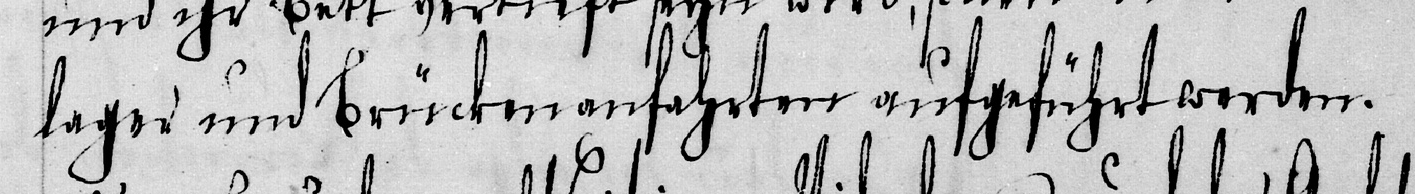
lager und Brückenanfahrten aufgeführt werden.
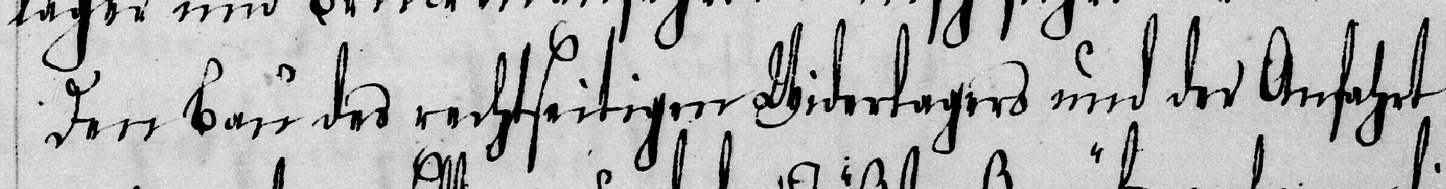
Den Bau des rechtseitigen Widerlagers und der Anfahrt
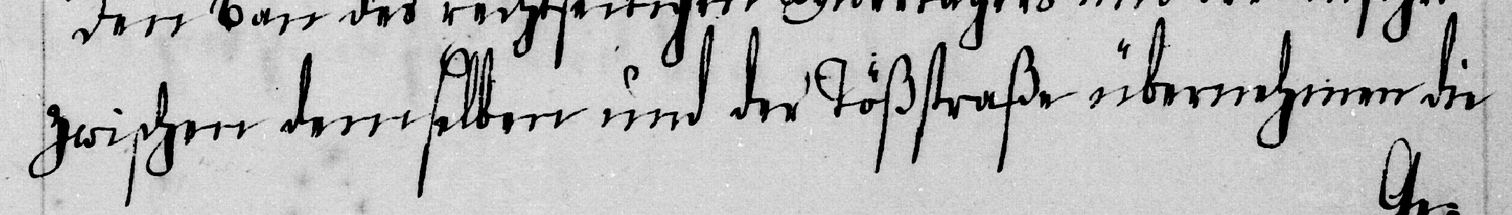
zwischen demselben und der Tößstraße übernehmen die
